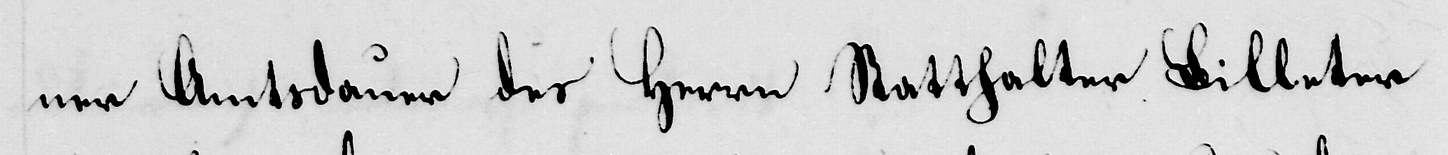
ner Amtsdauer des Herrn Statthalter Billeter
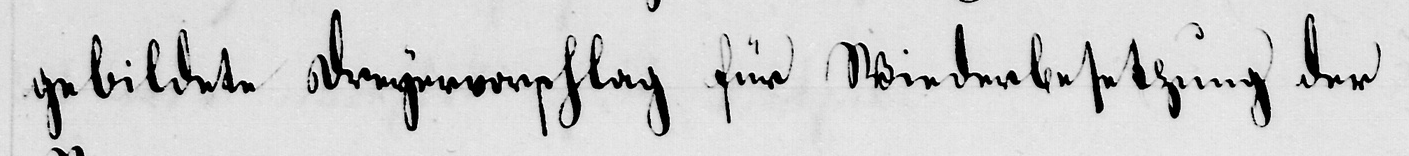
gebildete Dreyervorschlag für Wiederbesetzung der
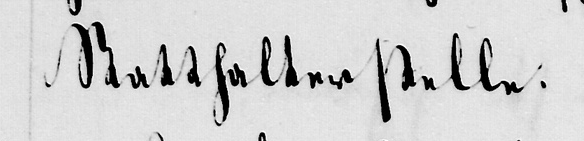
Statthalterstelle.
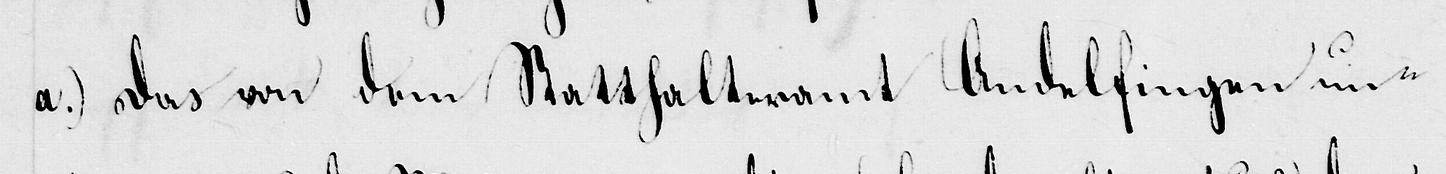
a.) Das von dem Statthalteramt Andelfingen un¬
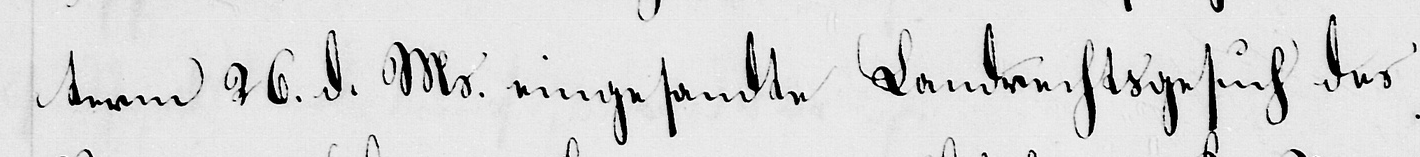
term 26. d. Ms. eingesandte Landrechtsgesuch des
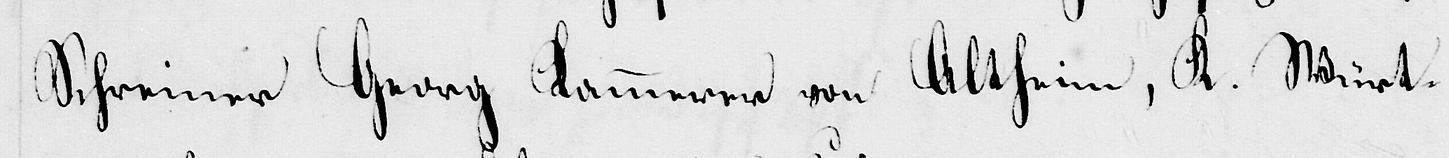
Schreiner Georg Kämmerer von Altheim, K. Würt¬
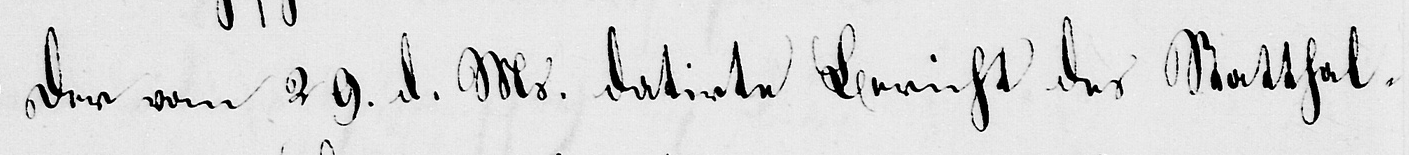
Der vom 29. d. Ms. datirte Bericht des Statthal¬
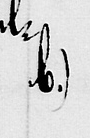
b.)
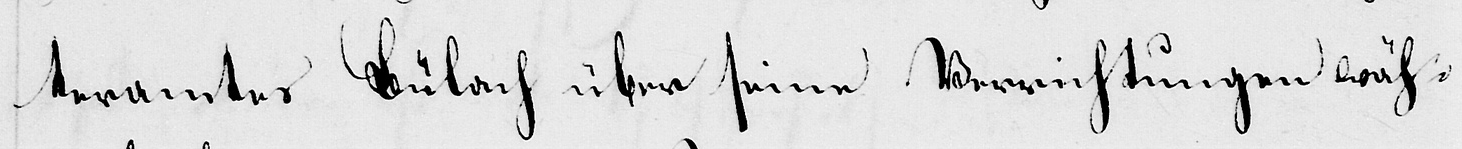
teramtes Bülach über seine Verrichtungen wäh¬
